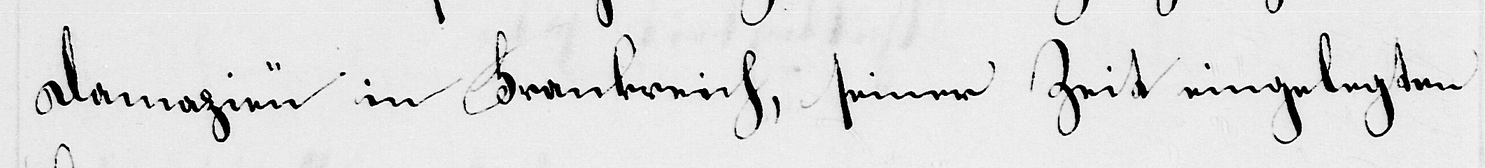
Damazieu in Frankreich, seiner Zeit eingelegten
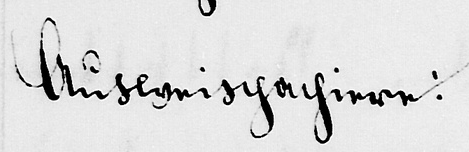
Ausweispapiere:
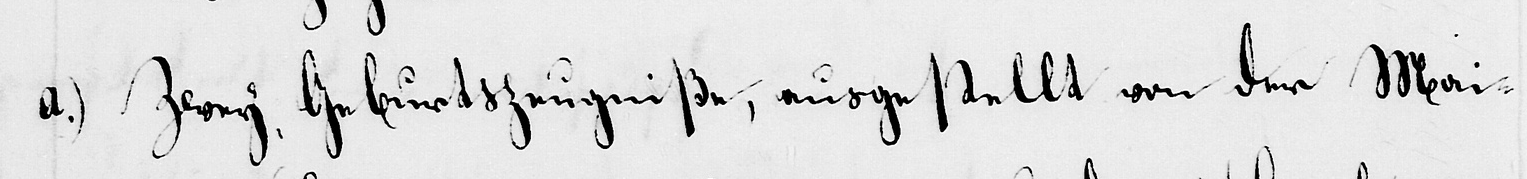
a.) Zwey, Geburtszeugniße, ausgestellt von der Mai¬
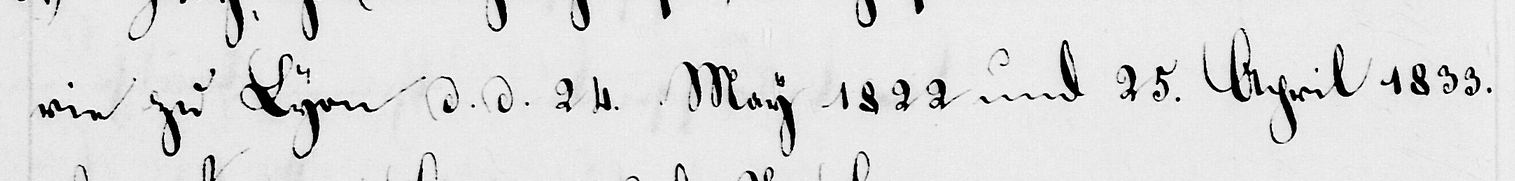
rie zu Lyon d. d. 24. May 1822. und 25. April 1833.
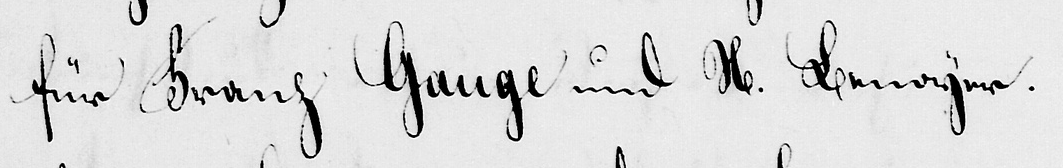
für Franz Gauge und N. Benayer.
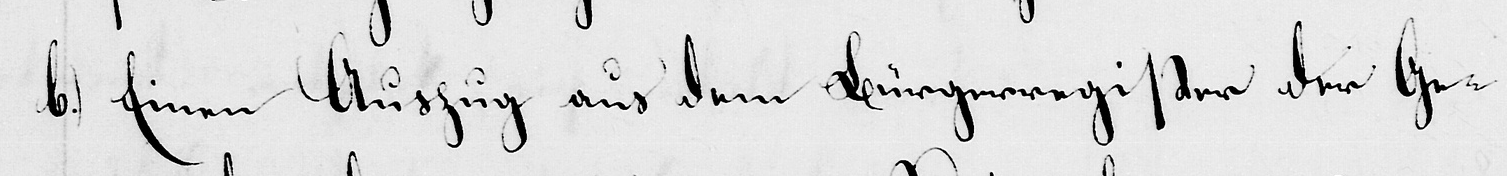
b.) Einen Auszug aus dem Bürgerregister der Ge¬
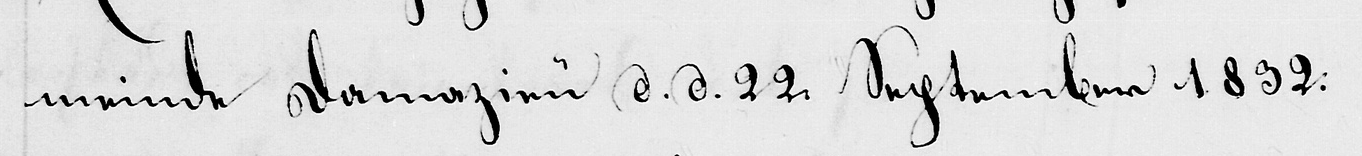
meinde Damazieu d. d. 22. September 1832.
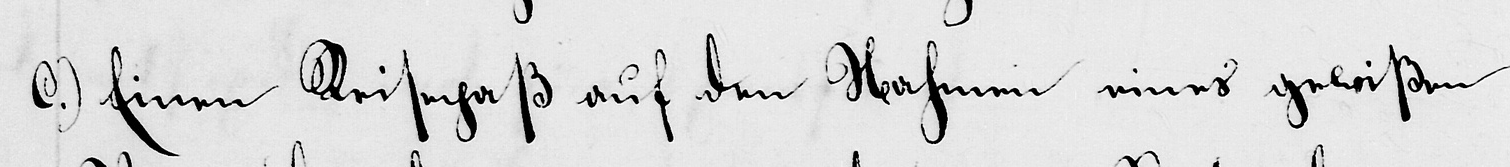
c.) Einen Reisepaß auf den Nahmen eines gewißen
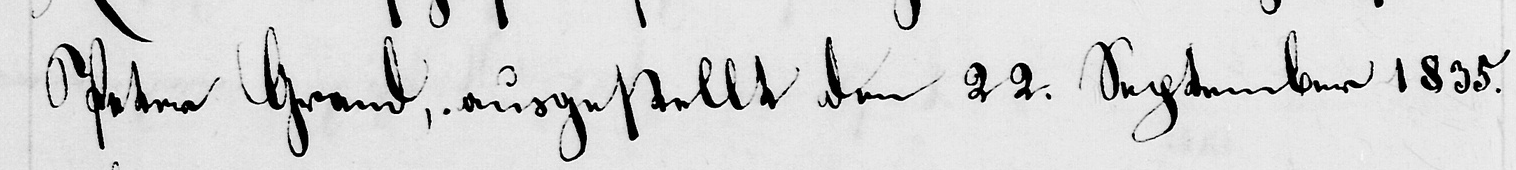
Peter Grand, ausgestellt den 22. September 1835.
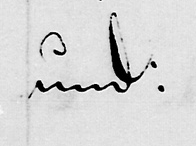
und:
